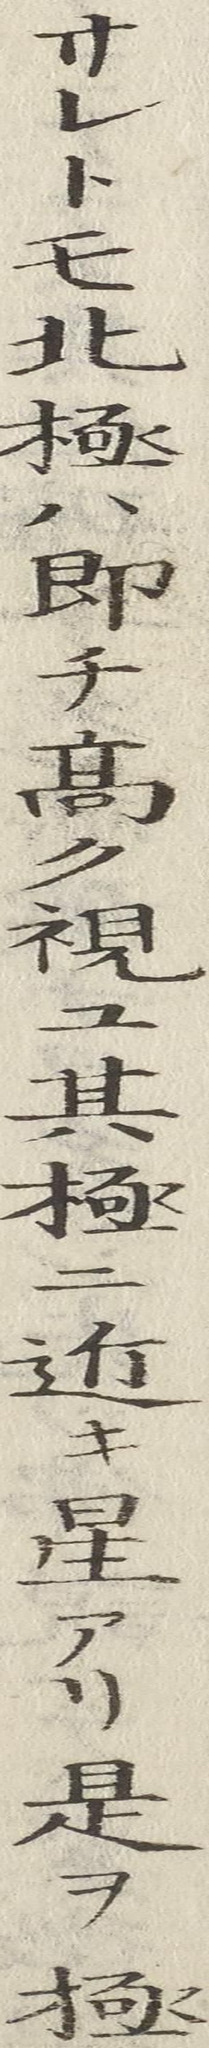サレトモ北極ハ即チ高ク視ユ其極ニ近キ星アリ是ヲ極
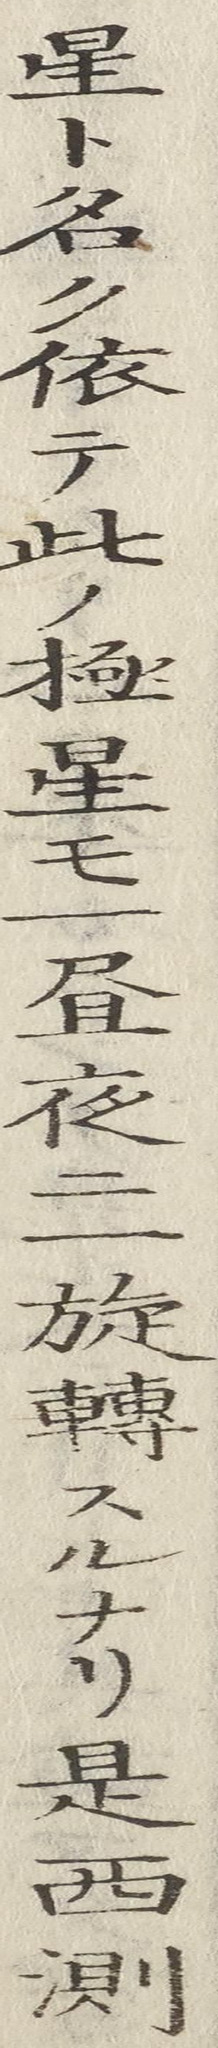星ト名ク依テ此ノ極星モ一昼夜ニ一旋転スルナリ是西測
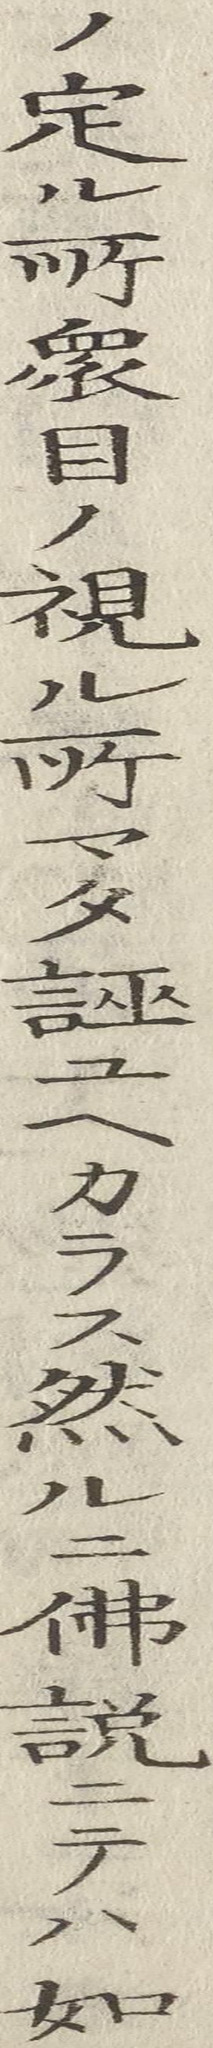ノ定ル所衆目ノ視ル所マタ誣ユヘカラス然ルニ仏説ニテハ如
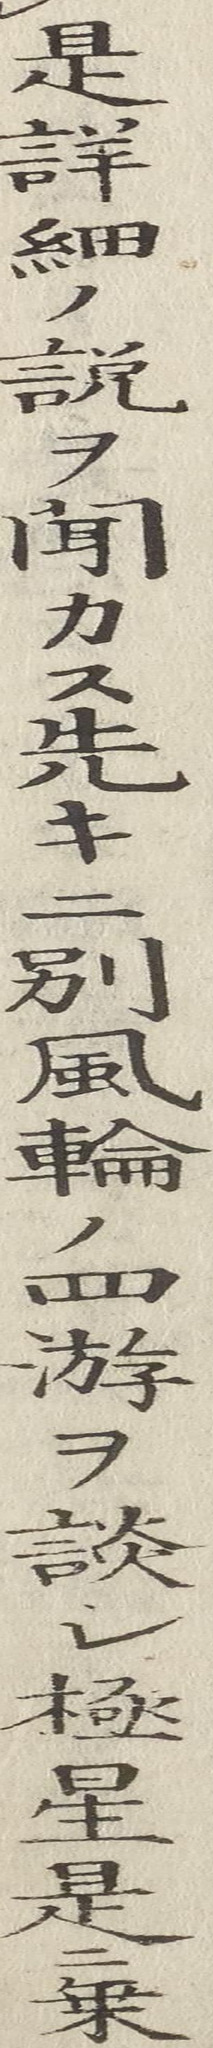是詳細ノ説ヲ聞カス先キニ別風輪ノ四游ヲ談シ極星是ニ乗

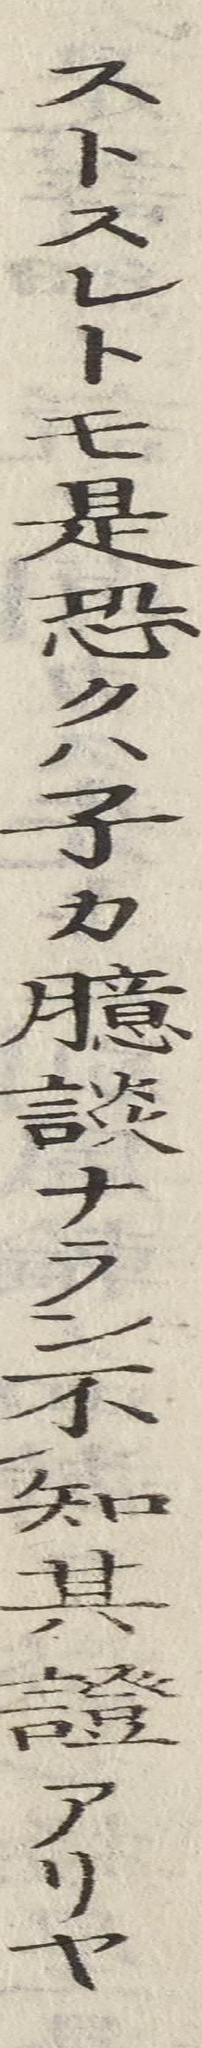ストスレトモ是恐クハ子カ臆談ナラン不知其証アリヤ
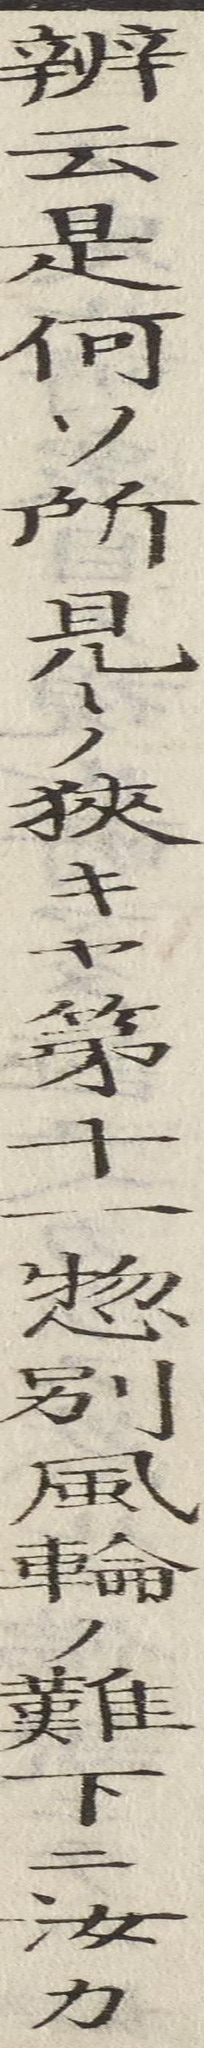弁云是何ソ所見ノ狭キヤ第十一惣別風輪ノ難下ニ汝カ
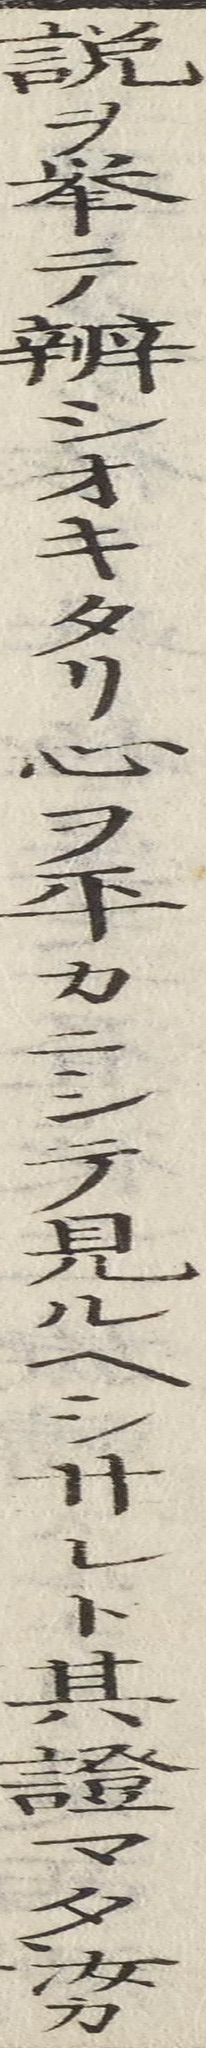説ヲ挙テ弁シオキタリ心ヲ平カニシテ見ルヘシサレト其証マタ汝カ
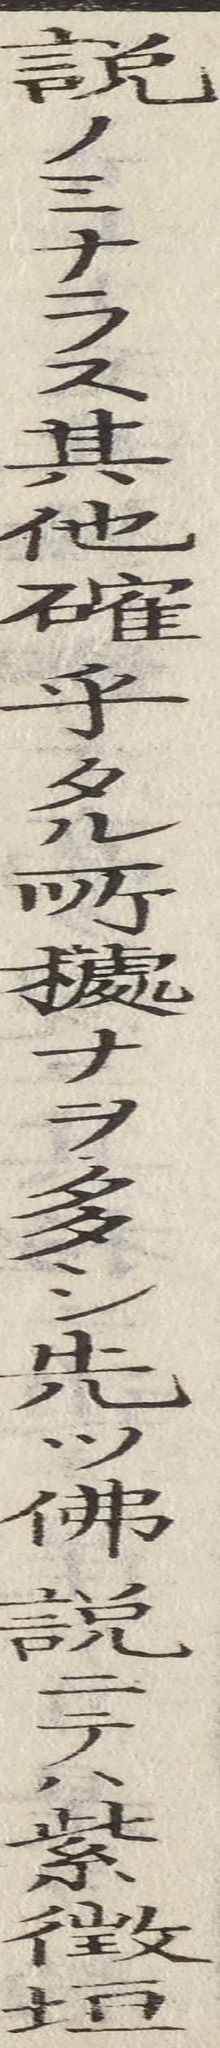説ノミナラス其他確乎タル所拠ナヲ多シ先ツ仏説ニテハ紫微垣
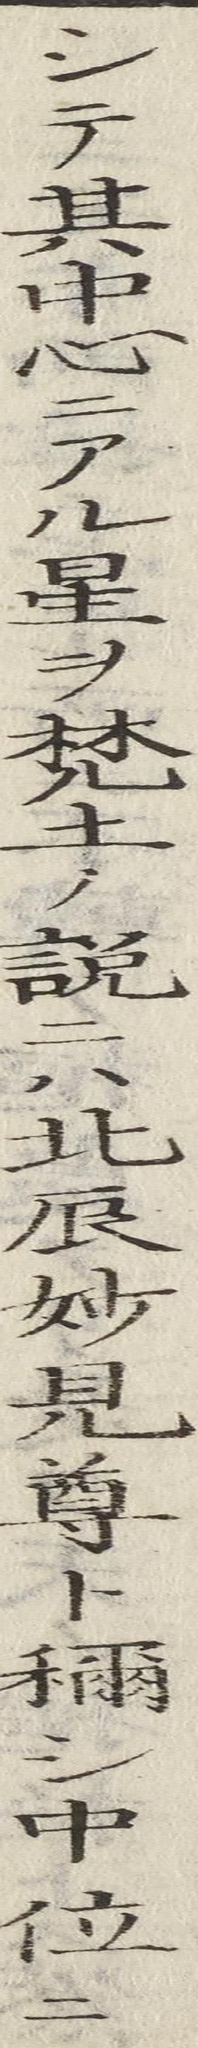シテ其中心ニアル星ヲ梵土ノ説ニハ北辰妙見尊ト称シ中位ニ
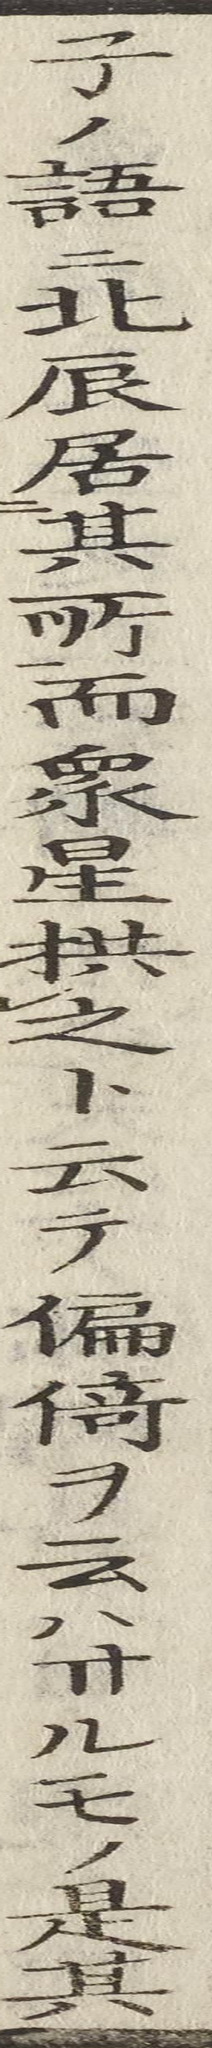子ノ語ニ北辰居ニ其所而衆星拱之ト云テ偏倚ヲ云ハサルモノ是其
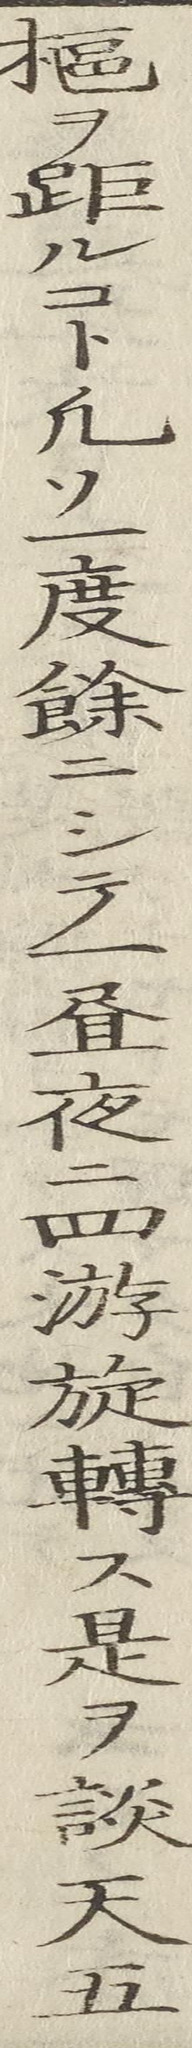枢ヲ距ルコト凡ソ一度余ニシテ一昼夜ニ四游旋転ス是ヲ談天五
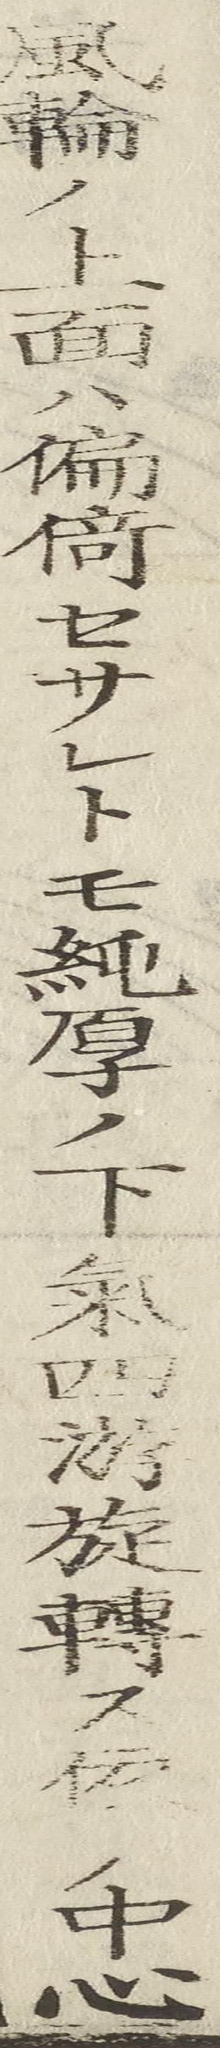風輪ノ上面ハ偏倚セサレトモ純厚ノ下気四游旋転ス依テ中心
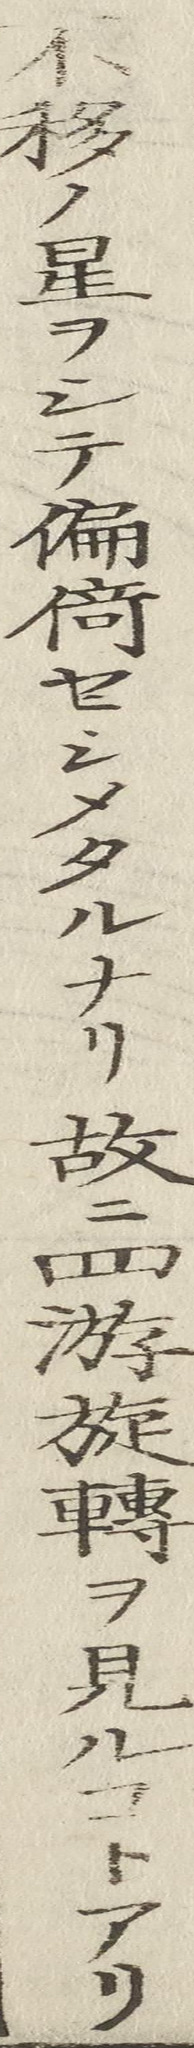不移ノ星ヲシテ偏倚セシメタルナリ故ニ四游旋転ヲ見ルコトアリ
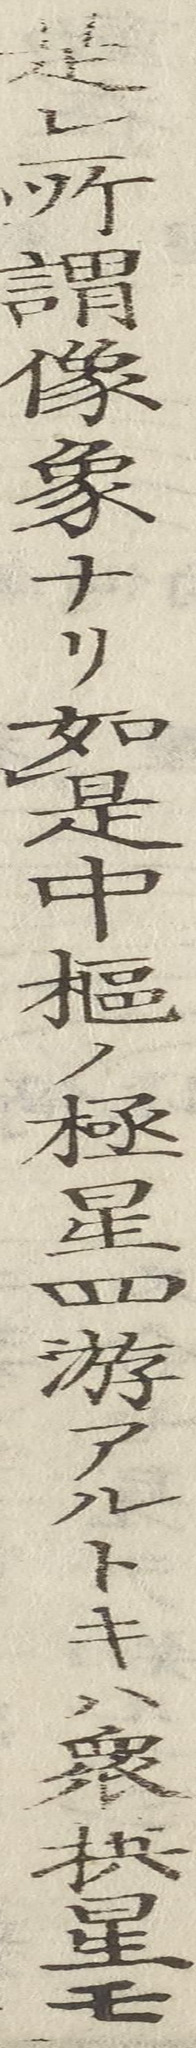是レ所謂像象ナリ如是中枢ノ極星四游アルトキハ衆栱星モ
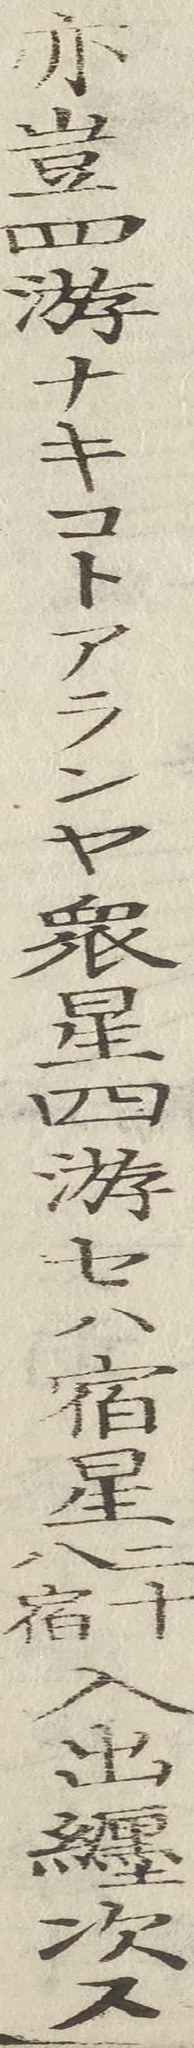亦豈四游ナキコトアランヤ衆星四游セハ宿星二十八宿入出纏次ス

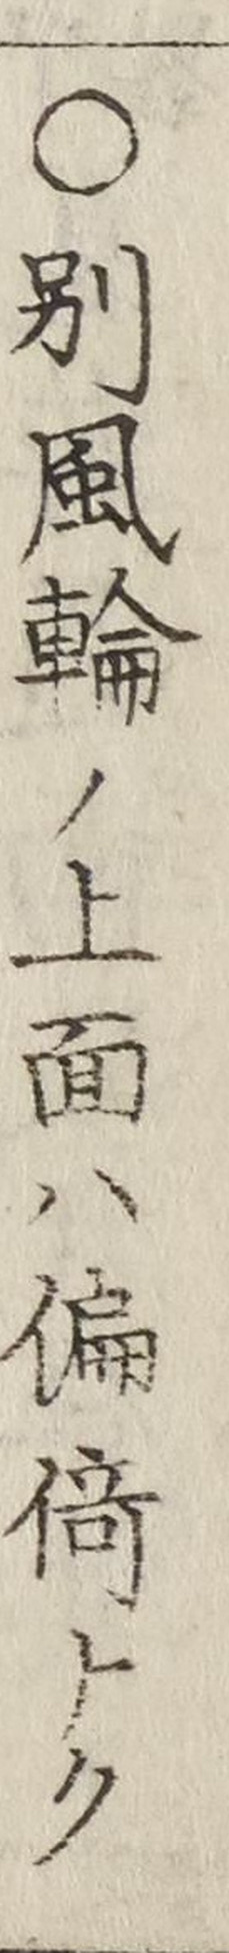〇別風輪ノ上面ハ偏倚トク
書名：護法新論　二編　中
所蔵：東京大学地震研究所図書室 Earthquake Research Institute Library, The University of Tokyo, JAPAN
